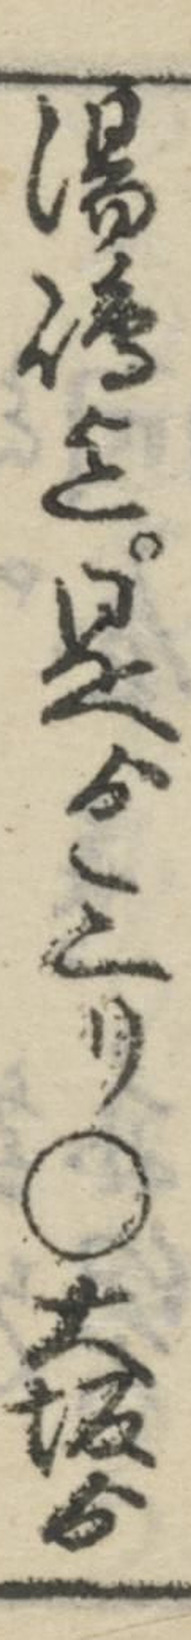湯嶋迄。是ゟ三り○大阪ゟ
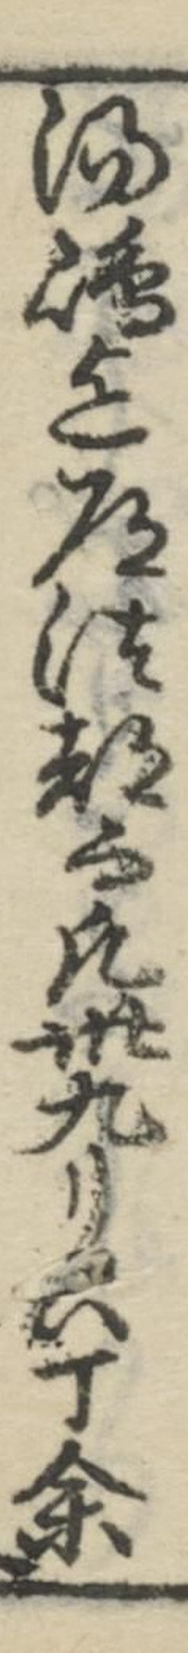湯嶋迄道法都而凡卅九り六丁余也
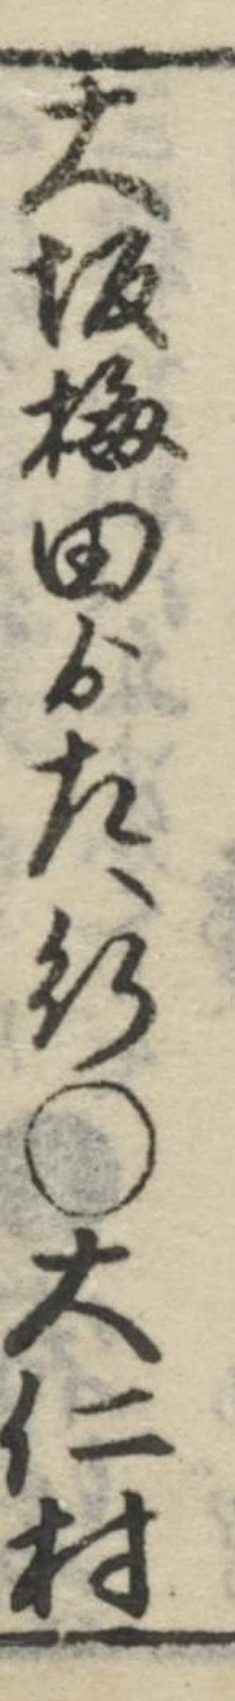大坂梅田ゟ左へ行○大仁村
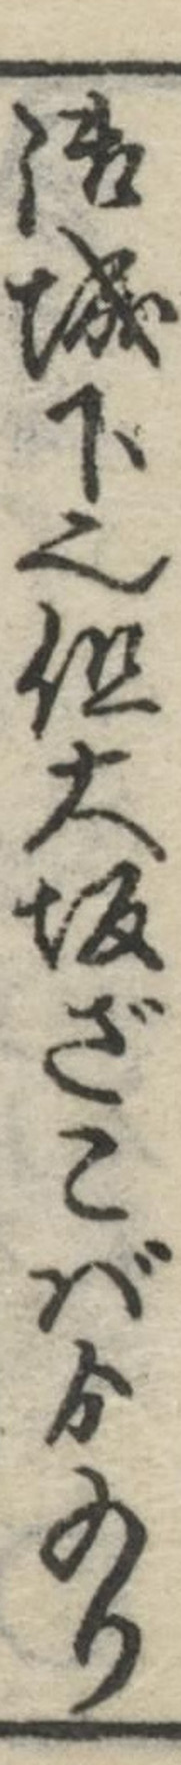御城下也但大坂さこばゟのり
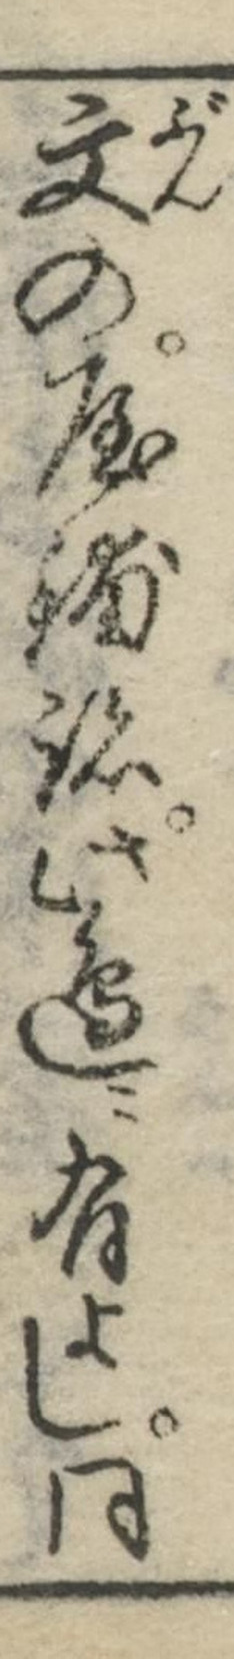文の。屋鋪跡。此辺に有よし。同

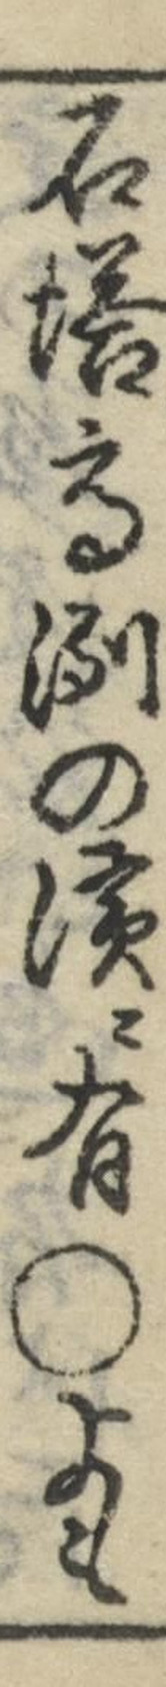石塔。高洲の浜に有。○よも
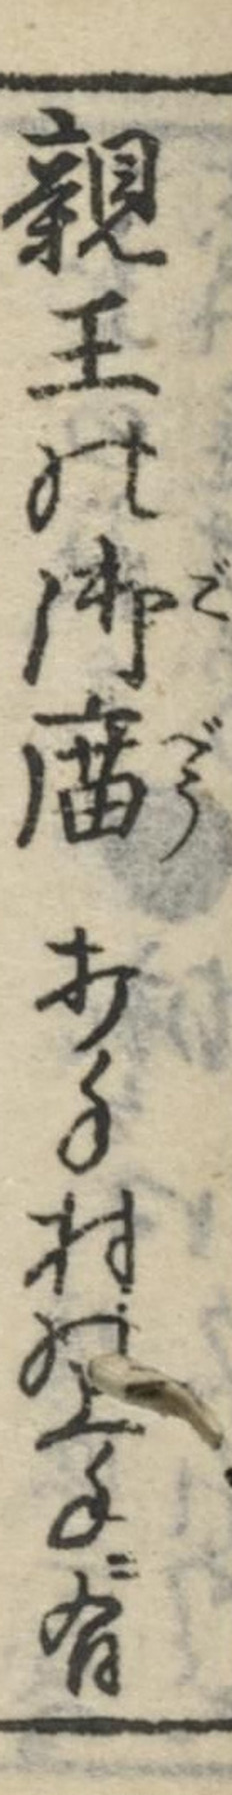親王の御廟打手村の上手に有
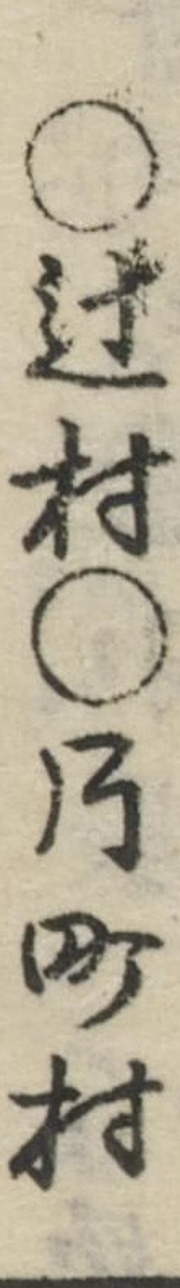○辻村○片町村

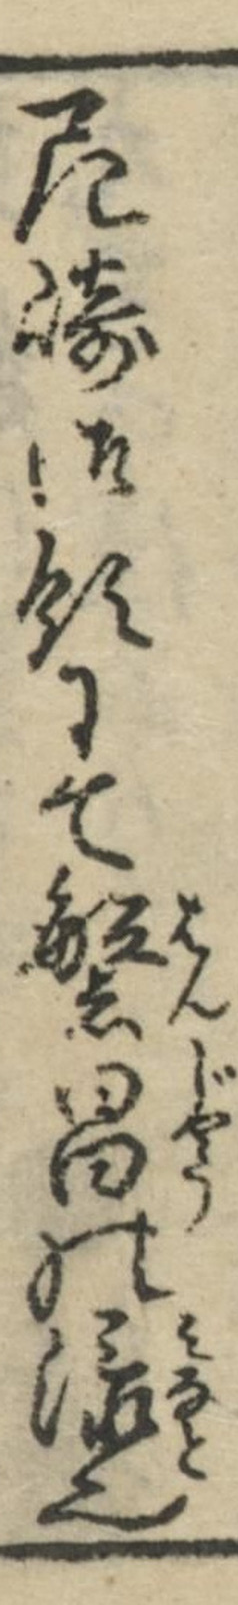尼崎御領にて繁昌の湊也

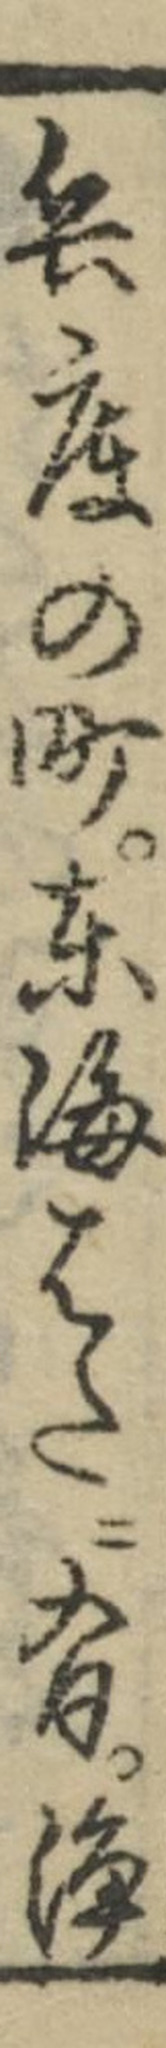兵庫の町。東海はたに有。浄
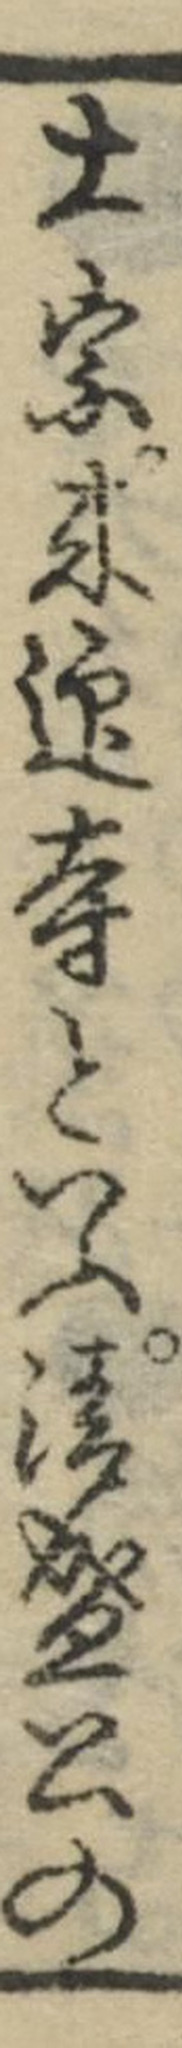土宗。来迎寺といふ。清盛公の
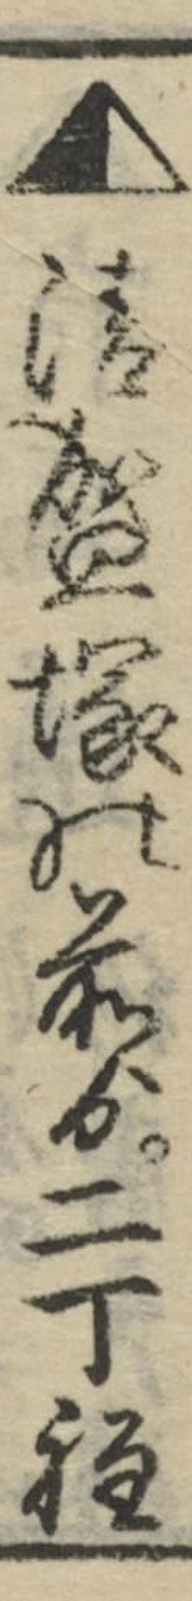▲清盛塚の前ゟ。二丁程
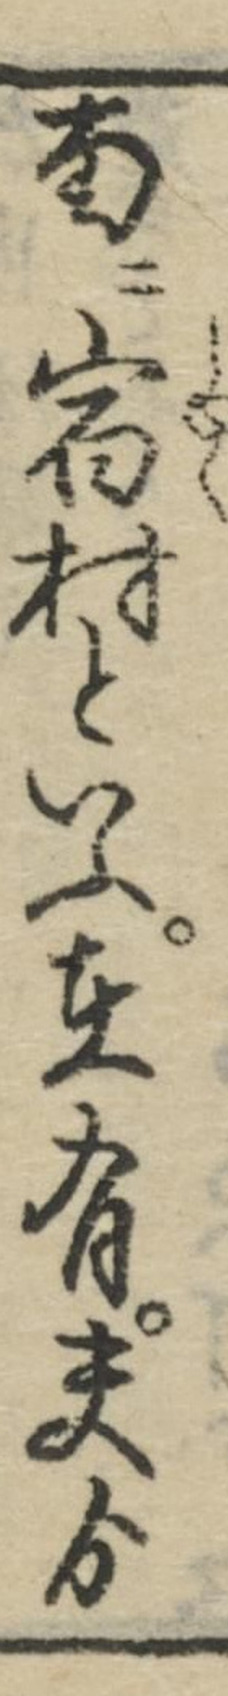南に宿村といふ。在有。夫ゟ
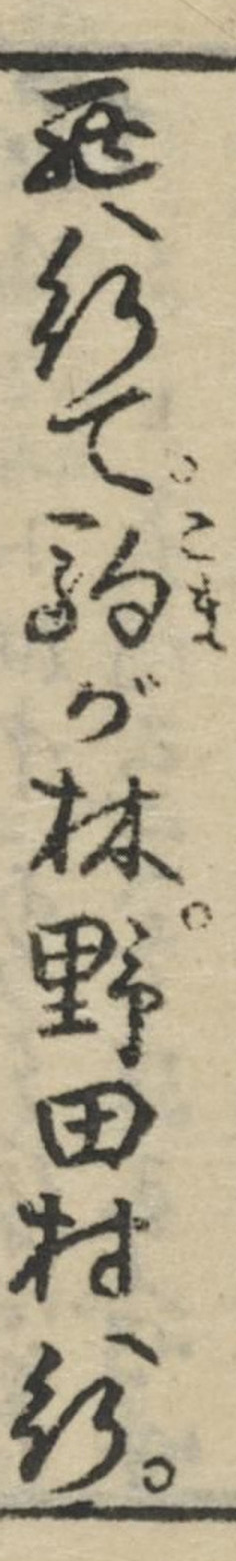西へ行て駒が林。野田村へ行。
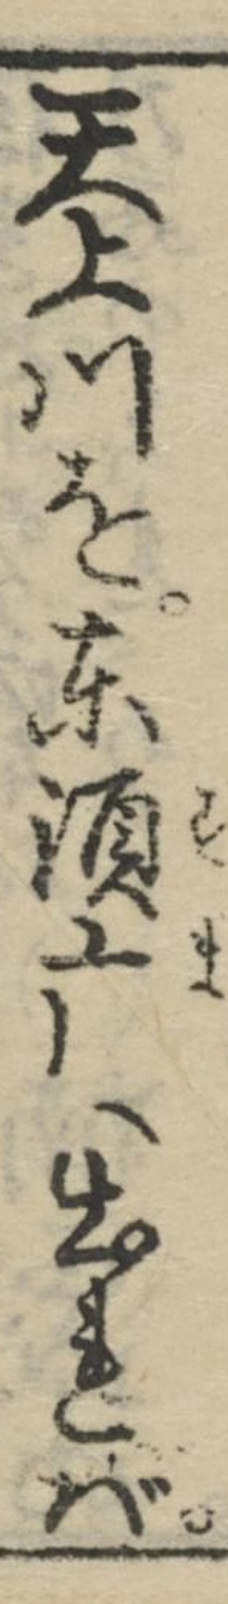天上川を。東須磨へ出れば。
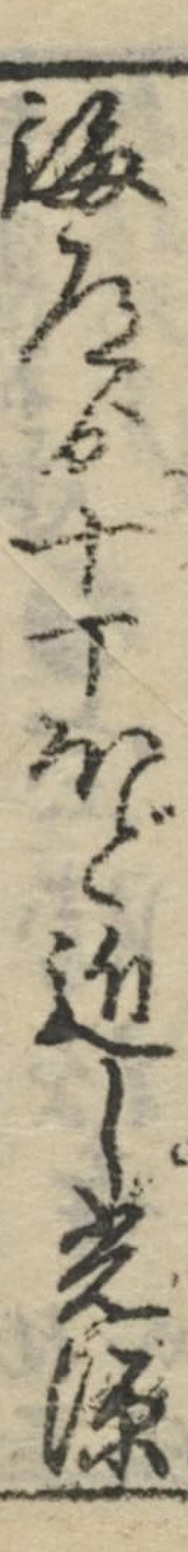海道ゟ十丁ほど近し。光源
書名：但州城崎浴湯辧
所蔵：東京大学地震研究所図書室 Earthquake Research Institute Library, The University of Tokyo, JAPAN
